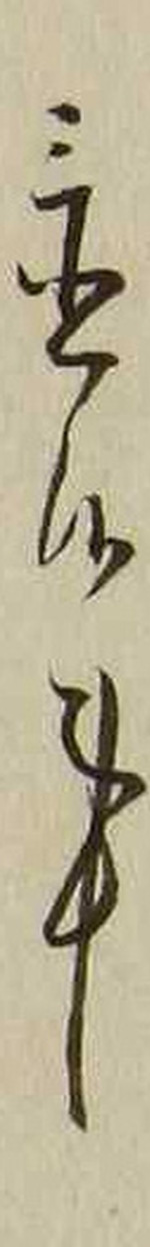置候事
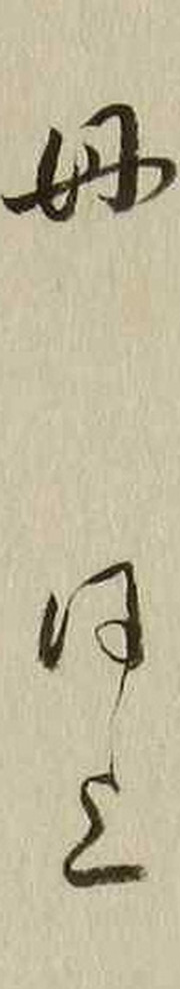母同上
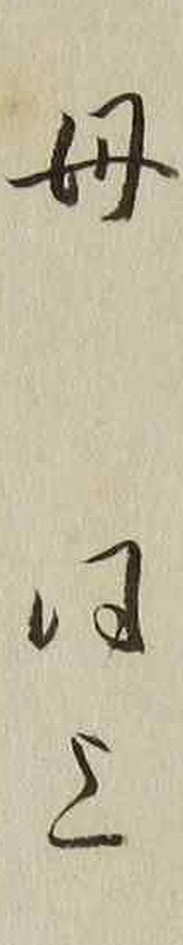母同上
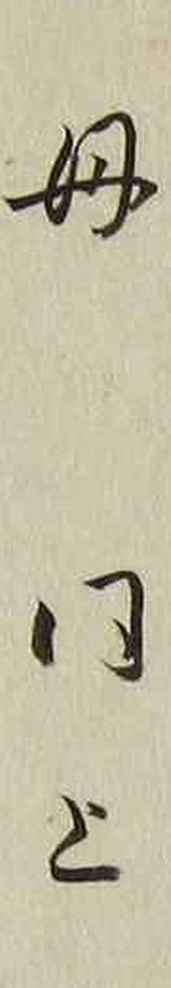母同上

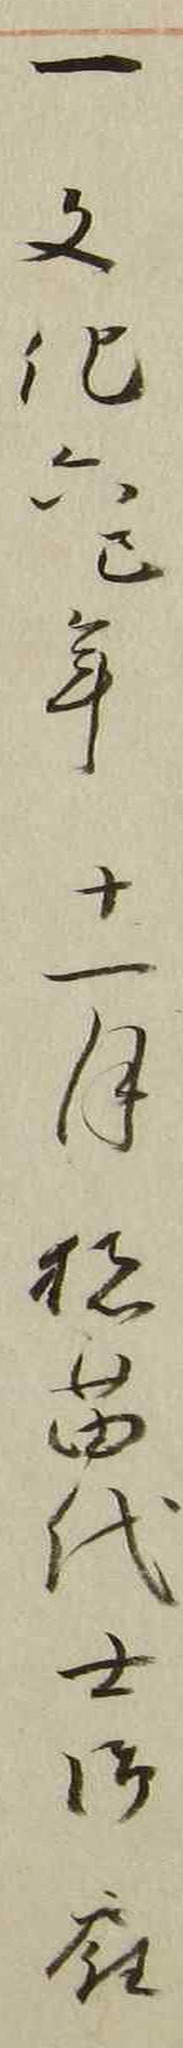一文化六巳年十一月猪苗代士御雇
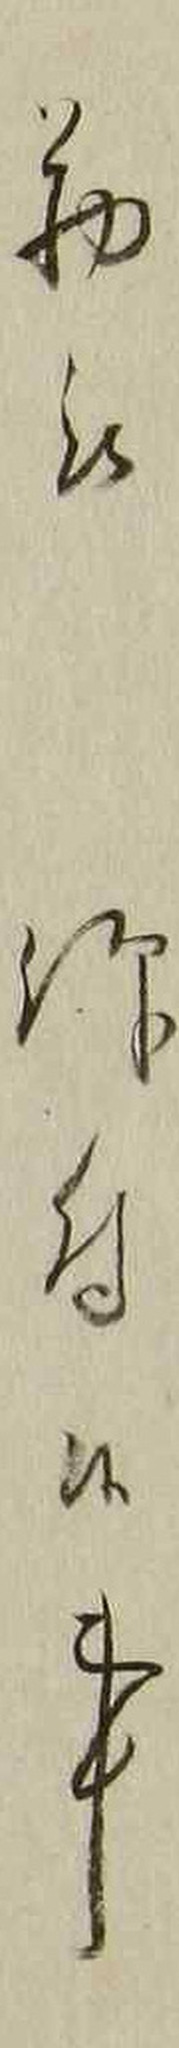勤被仰付候事
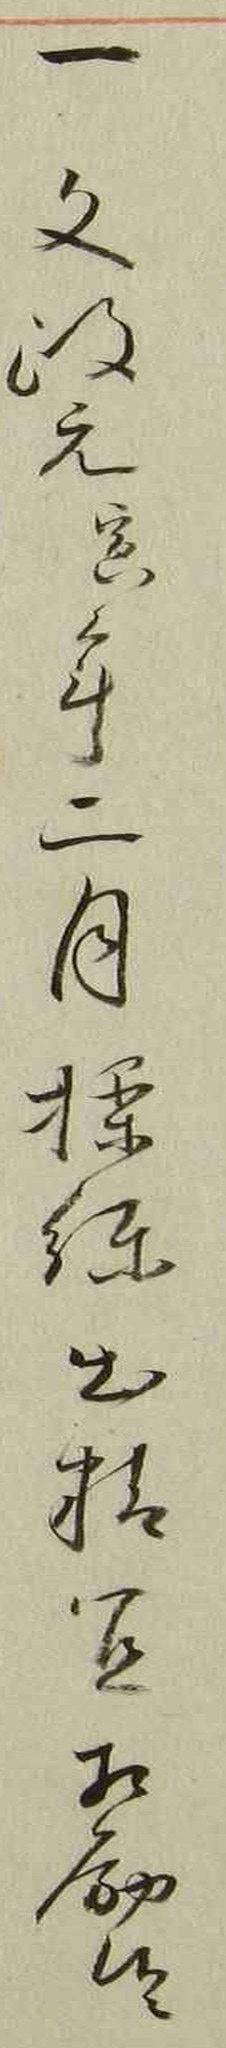一文政元寅年二月操練出精宜相励候ニ
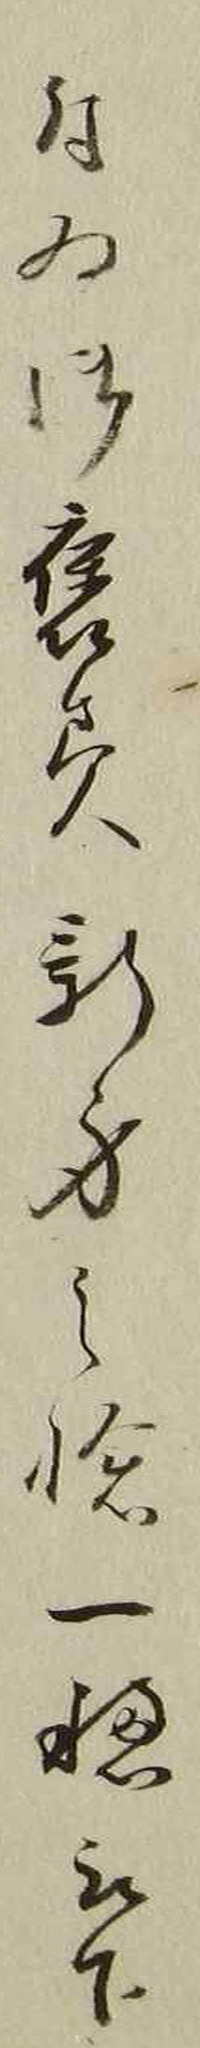付為御褒美新身之槍一穂被下
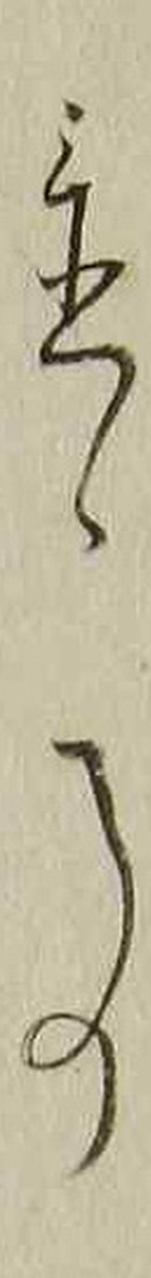置候事
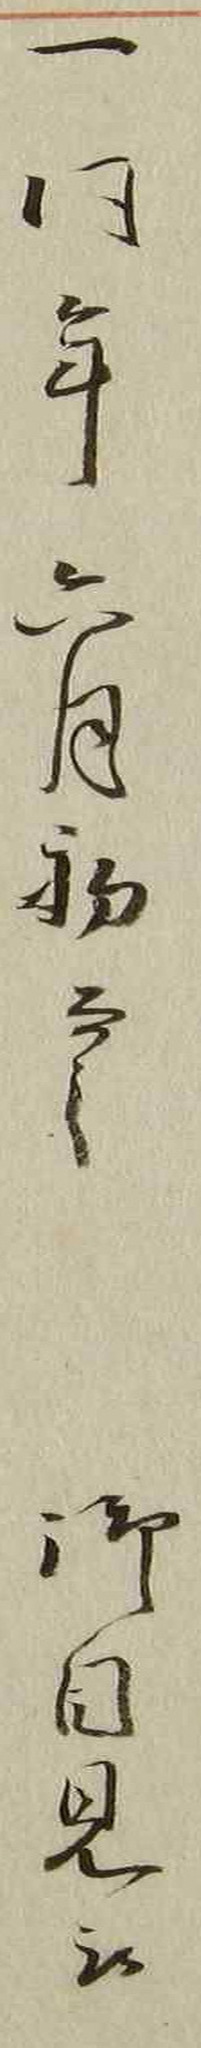一同年六月初而之御目見被
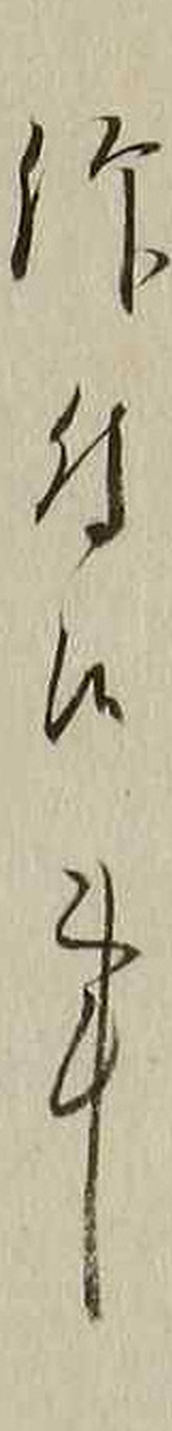仰付候事
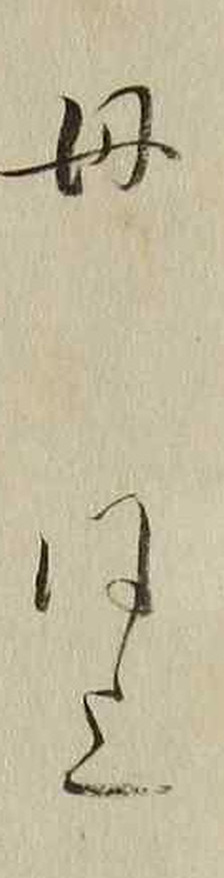母同上
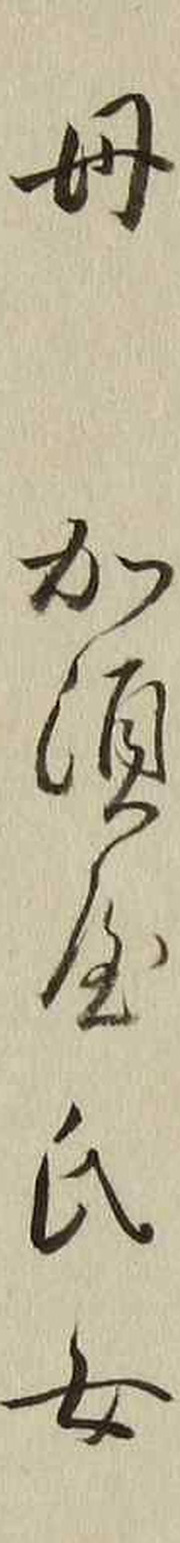母加須屋氏女
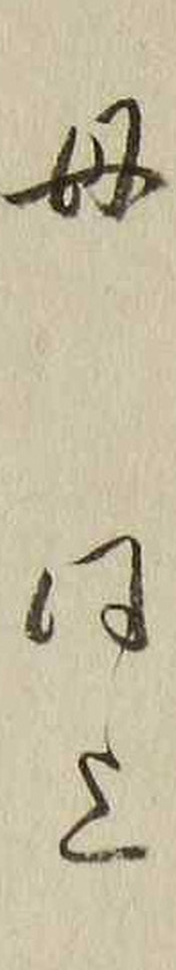母同上

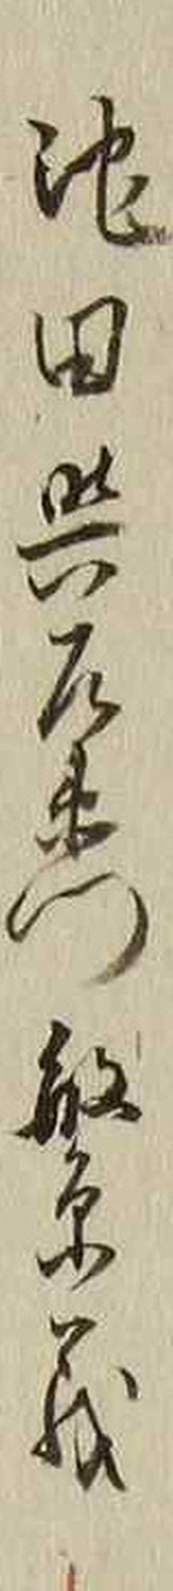池田與左衛門繁義
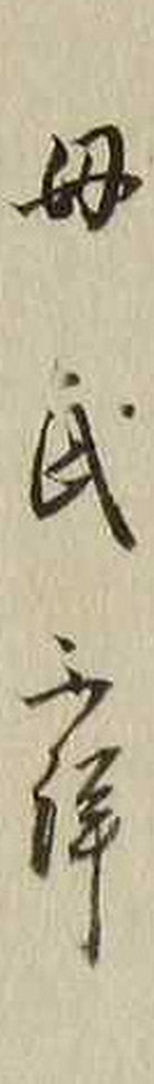母氏不祥
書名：諸士系譜　巻之32　い之部32
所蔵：会津若松市立会津図書館
